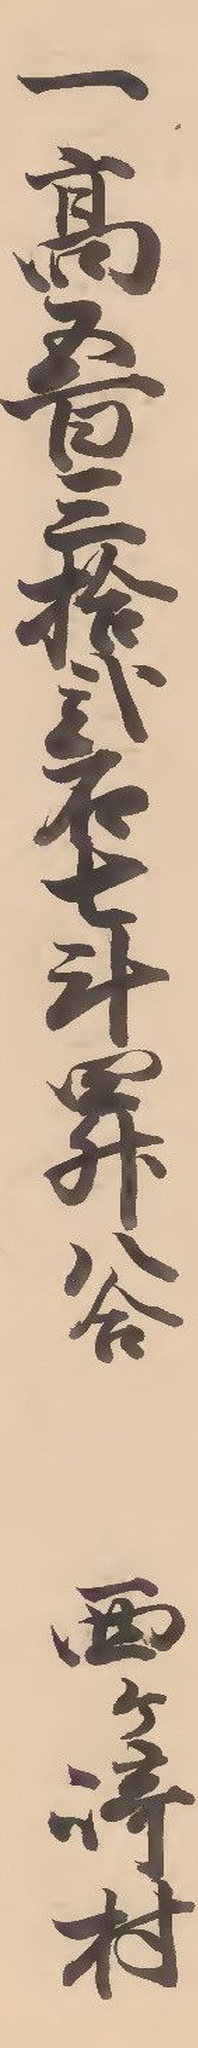一高五百三拾弐石七斗四升八合西ヶ崎村

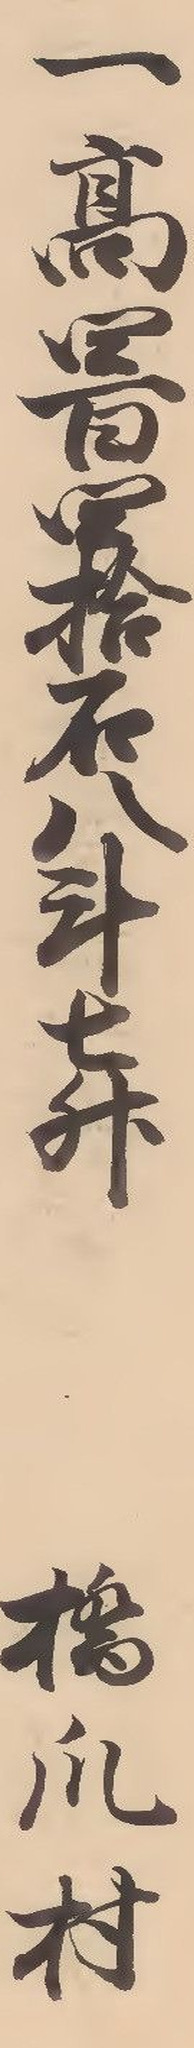一高四百四拾石八斗七升橋爪村
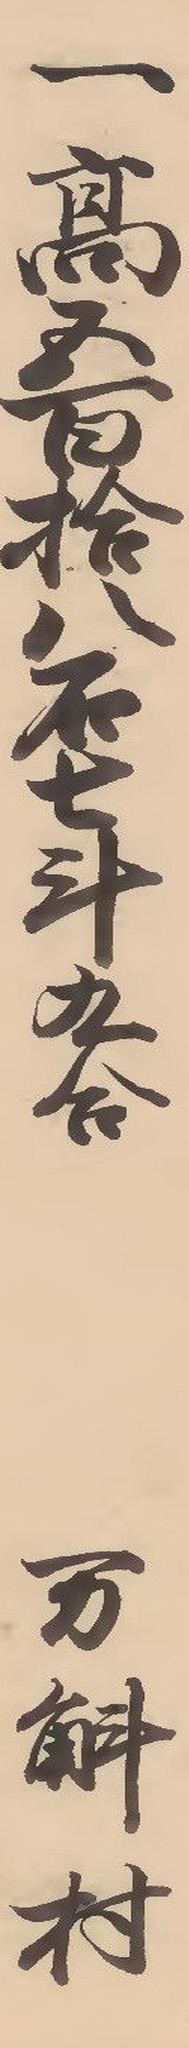一高五百拾八石七斗九合万斛村
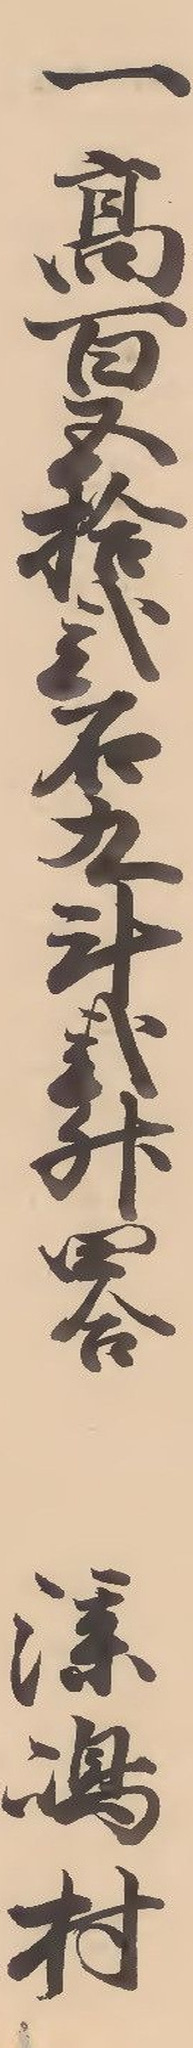一高百五拾弐石九斗弐升四合漆島村

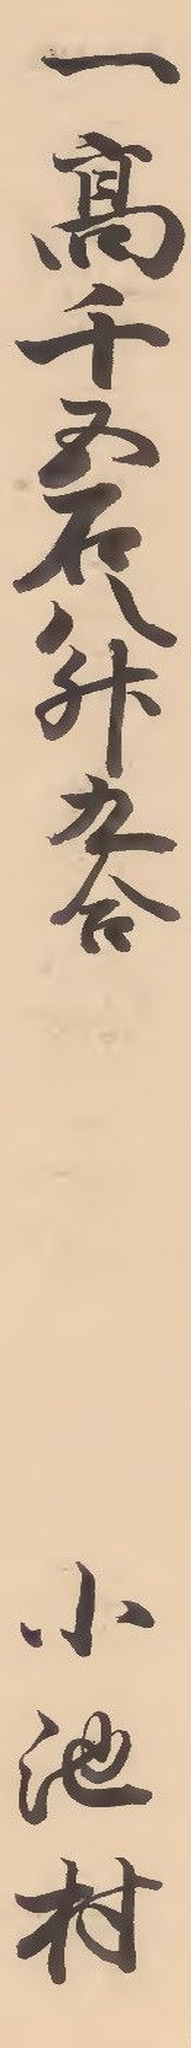一高千五石八升九合小池村
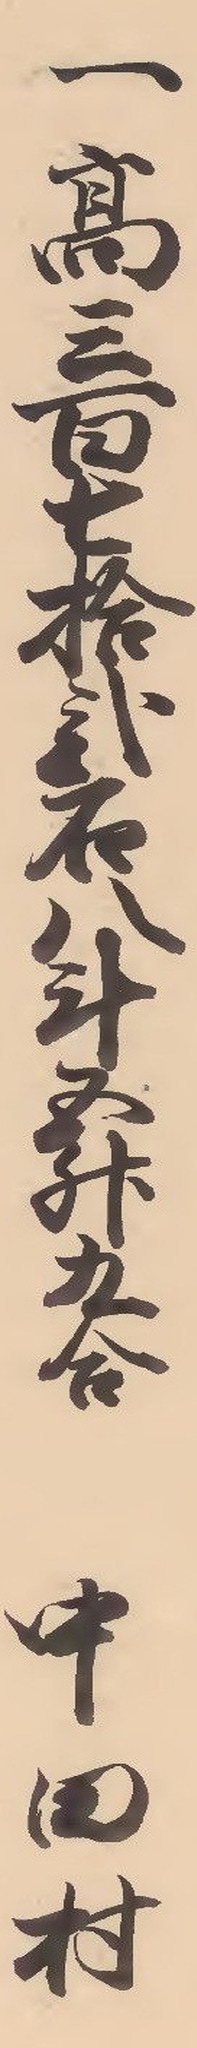一高三百七拾弐石八斗五升九合中田村
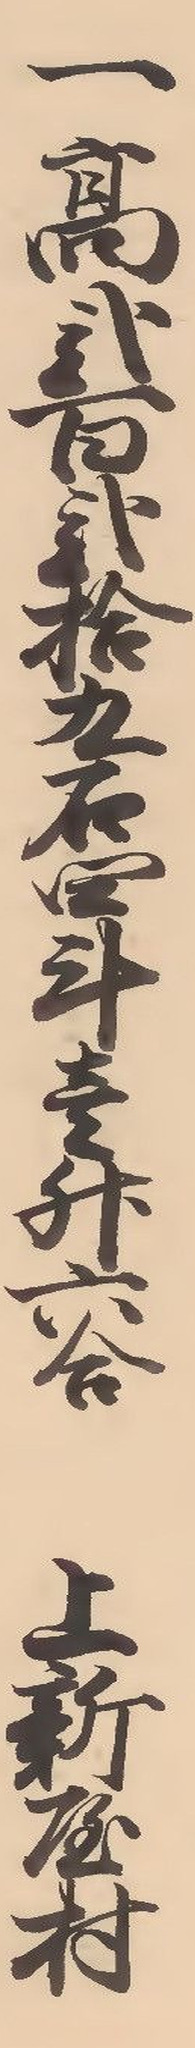一高弐百弐拾九石四斗壱升六合上新屋村
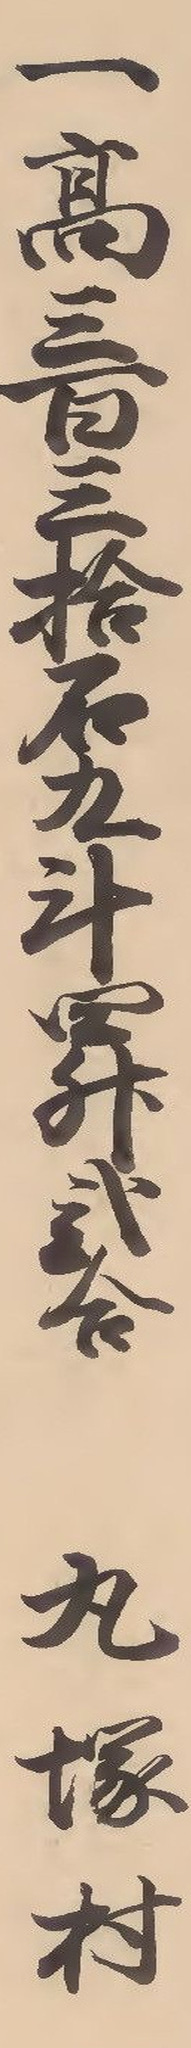一高三百三拾石九斗四升弐合丸塚村
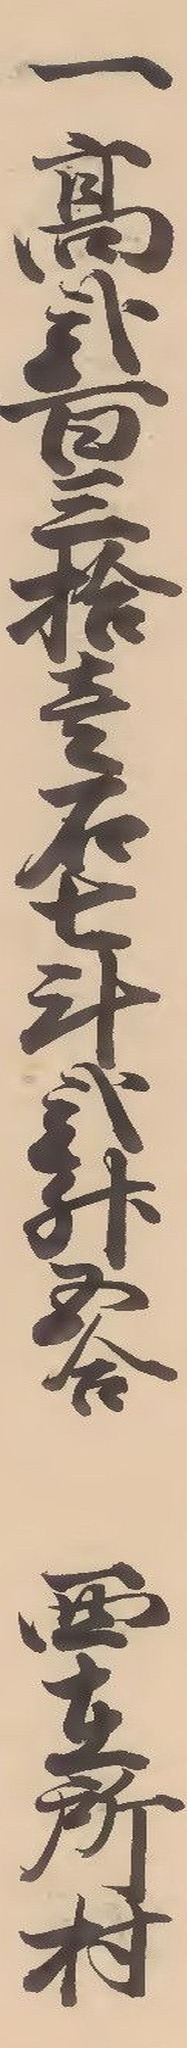一高弐百三拾壱石七斗弐升五合西在所村
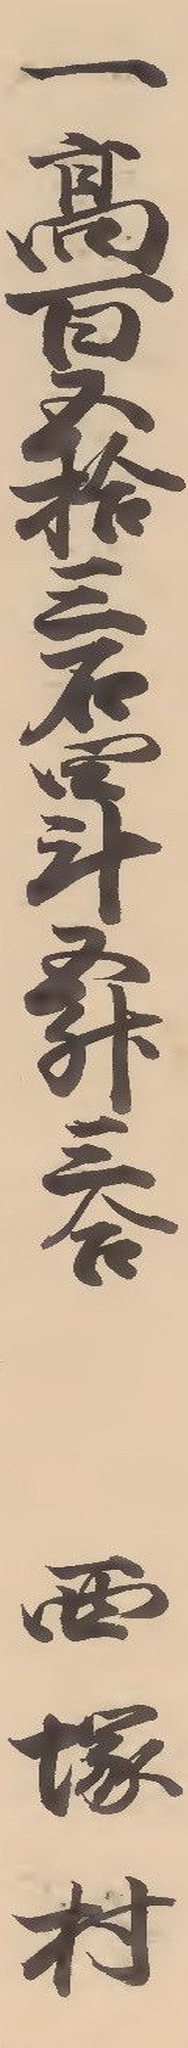一高百五拾三石四斗五升三合西塚村
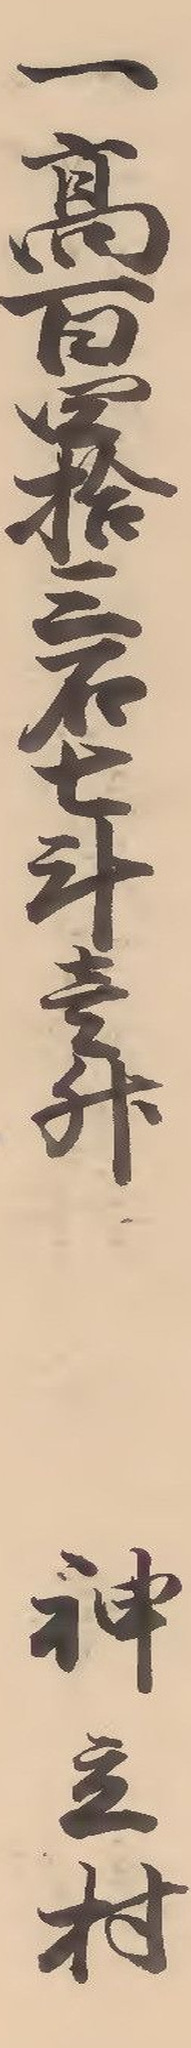一高百四拾三石七斗壱升神立村

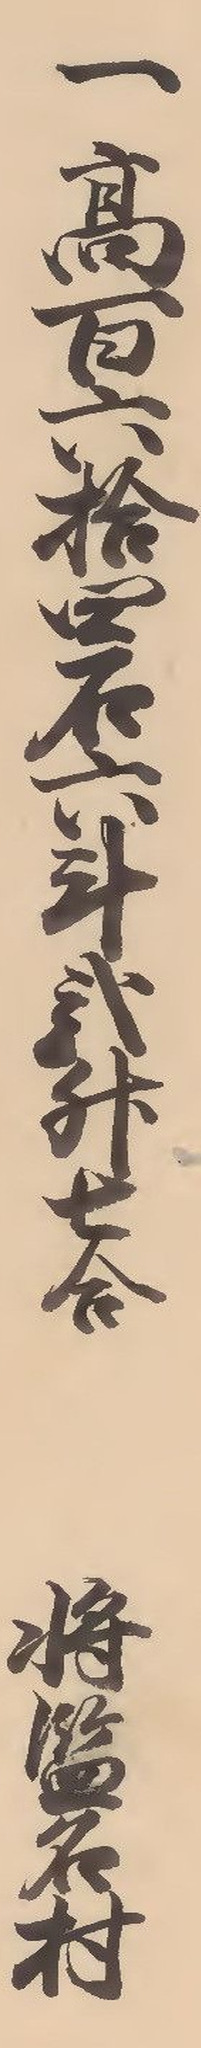一高百六拾四石六斗弐升七合将監名村
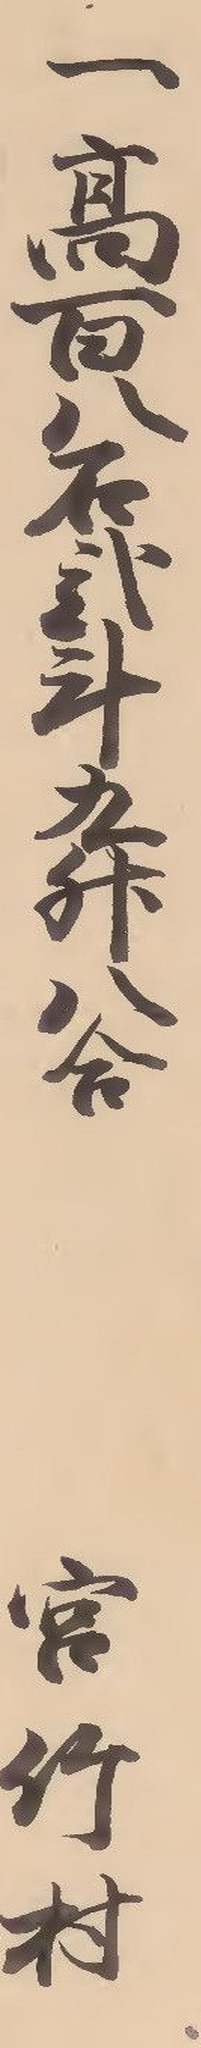一高百八石弐斗九升八合宮竹村
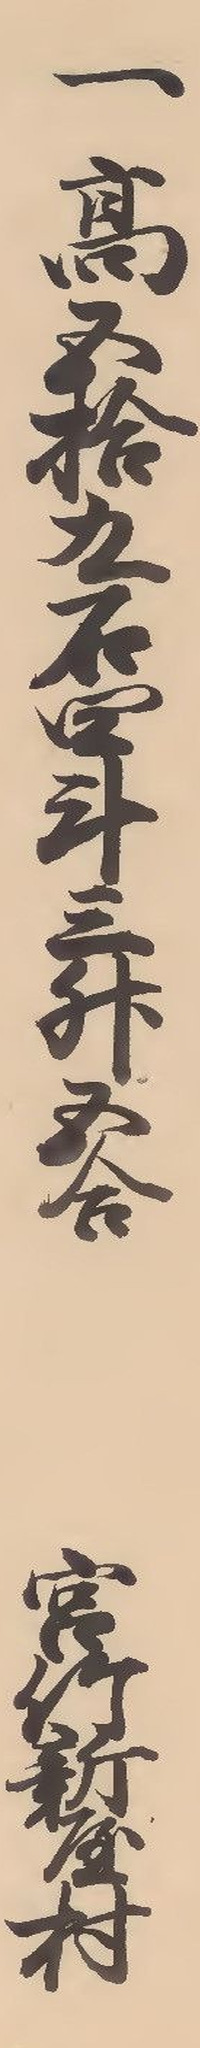一高五拾九石四斗三升五合宮竹新屋村
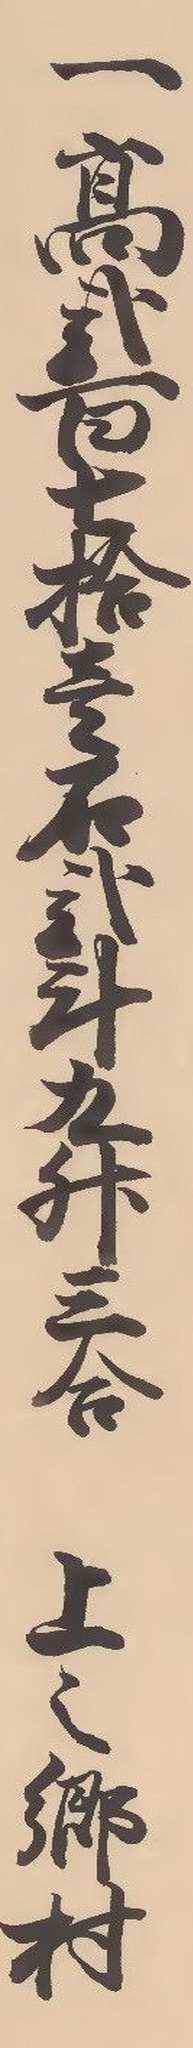一高弐百七拾壱石弐斗九升三合上之郷村
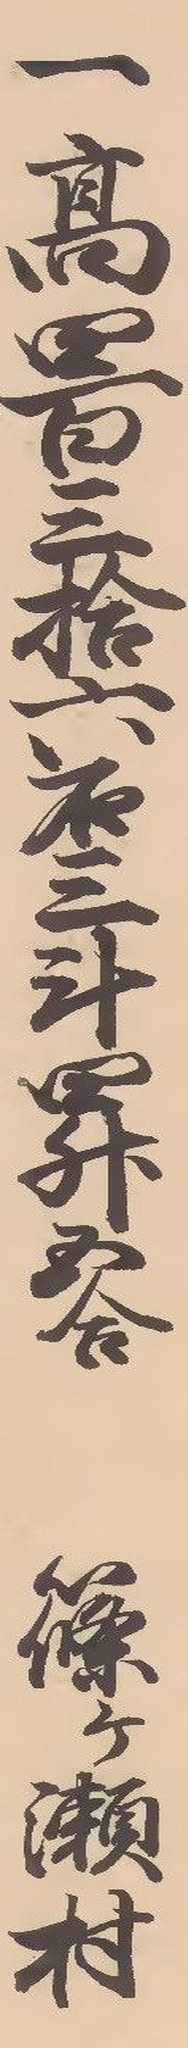一高四百三拾六石三斗四升五合篠ヶ瀬村
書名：遠江国郷帳
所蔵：国立公文書館 National Archives of Japan
